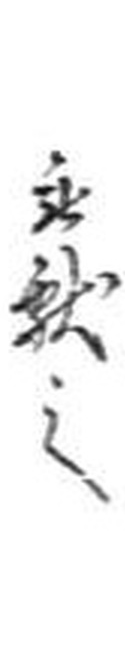被献之
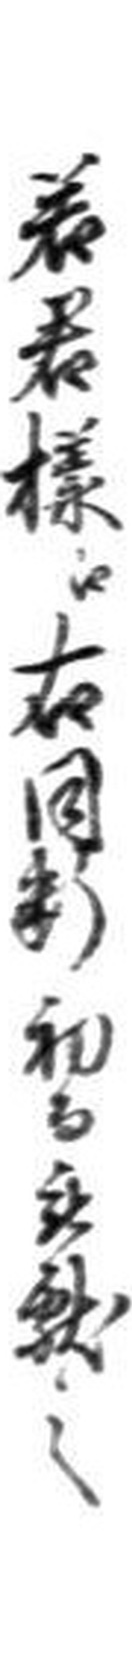若君様江右同断初而被献之
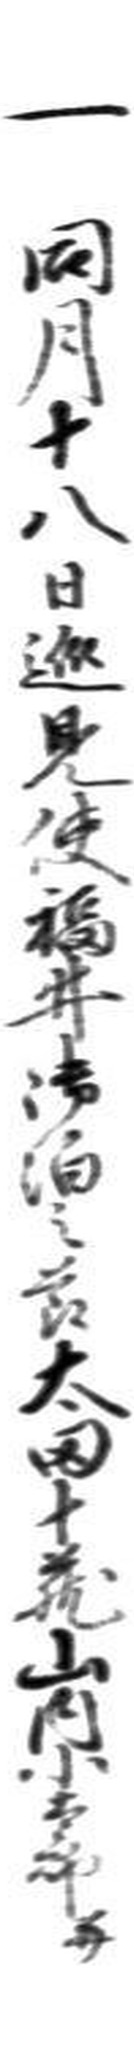一同月十八日巡見使福井御泊之節太田十蔵山内小太郎并
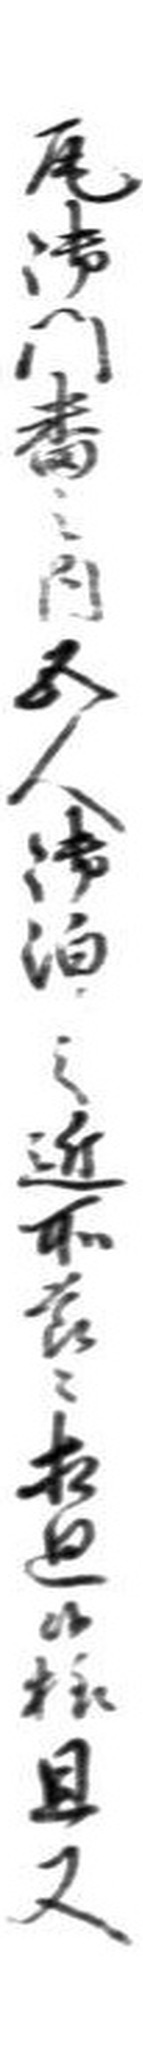瓦御門番之内五人御泊之近所節々相廻候様且又
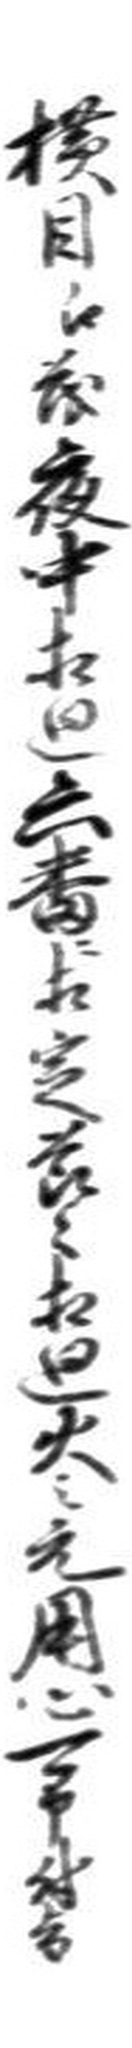横目江も夜中相廻六番ニ相定節々相廻火之元用心可申付旨
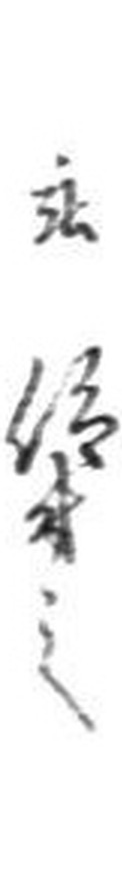被仰付之

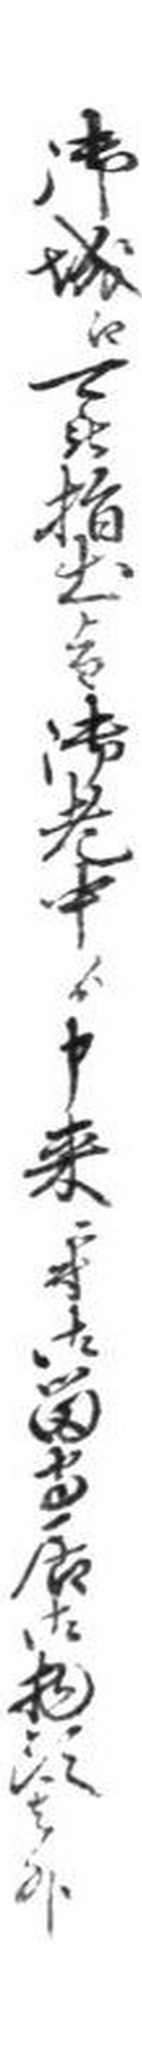御城江可被指出旨御老中ゟ申来ニ付御留守居御物頭其外
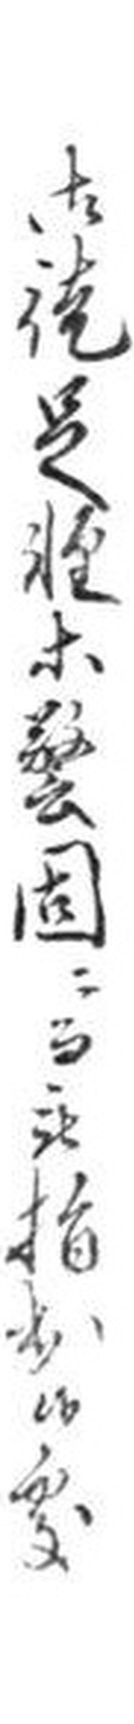御徒足軽等警固ニ而被指出候処
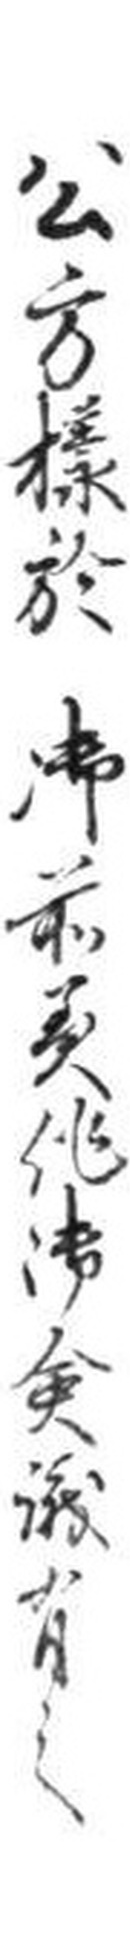公方様於御前美作御僉議有之
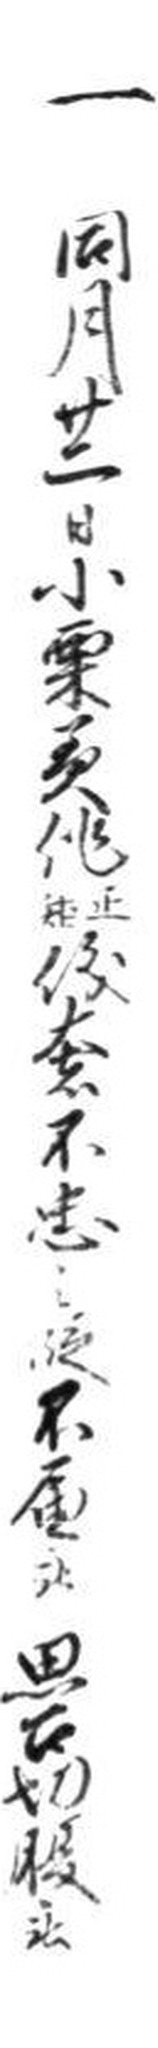一同月廿二日小栗美作正矩儀奢不忠之段不届被思召切腹被
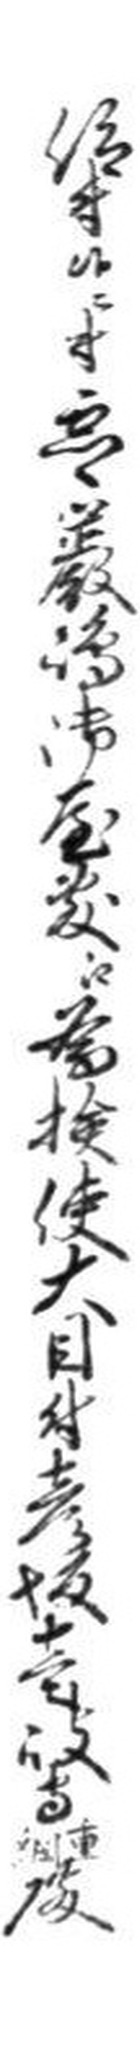仰付候ニ付霊巌島御屋敷江為検使大目付彦坂壱岐守重綱殿
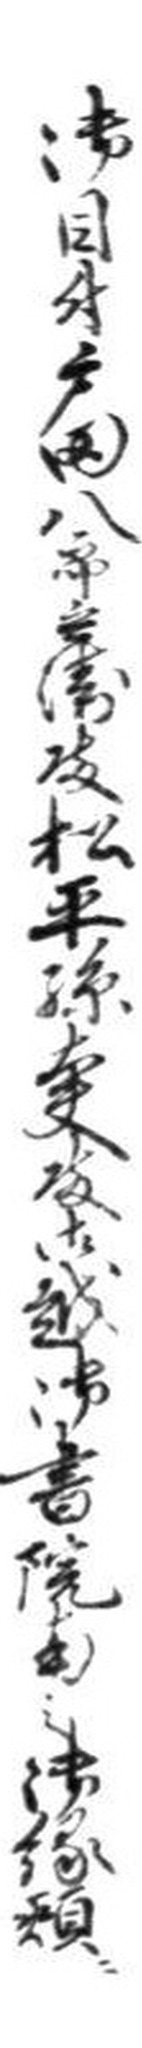御目付戸田八郎兵衛殿松平孫大夫殿御越御書院南之御縁頬ニ
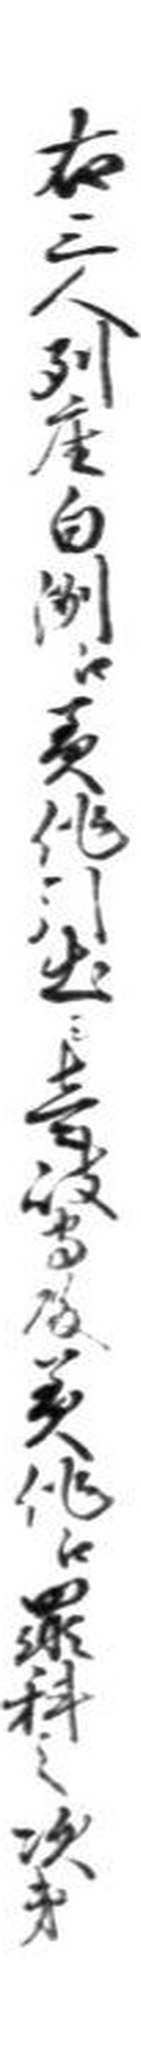右三人列座白洲江美作引出シ壱岐守殿美作江罪科之次第
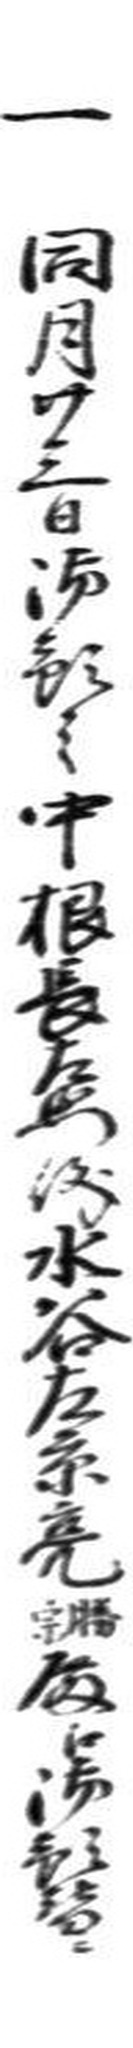一同月廿三日御預之中根長左衛門儀水谷左京亮勝宗殿江御預替ニ
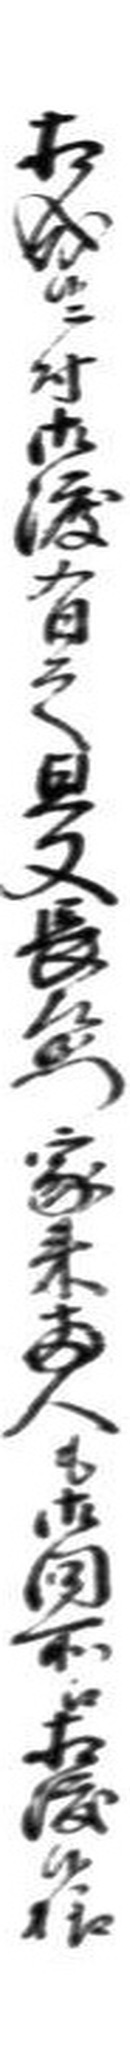相成候ニ付御渡有之且又長左衛門家来両人も御同所江相渡候様
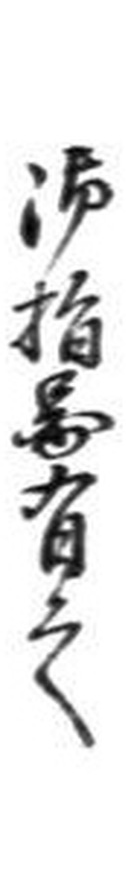御指図有之
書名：家譜 十五 綱昌公 従天和元年到元禄十二年
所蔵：福井県文書館 Fukui Prefectural Archives
